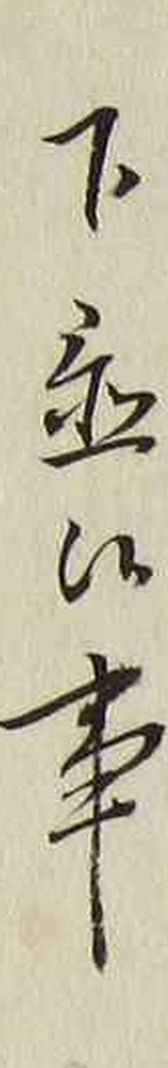下置候事
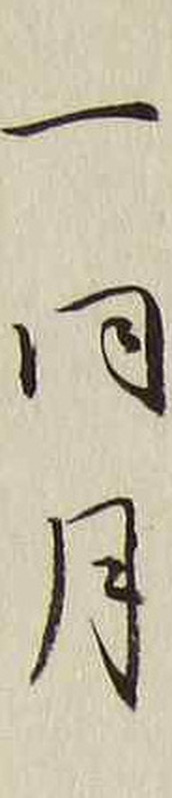一同月

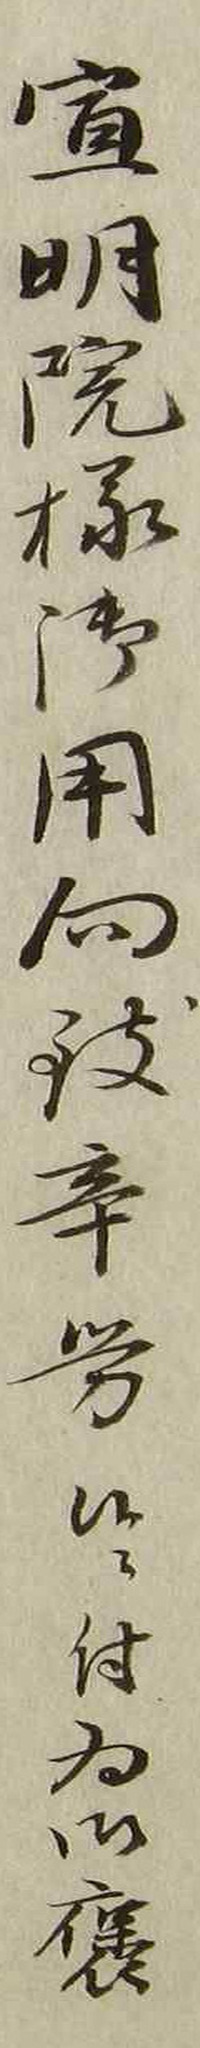宣明院様御用向辛労致し候ニ付き御褒
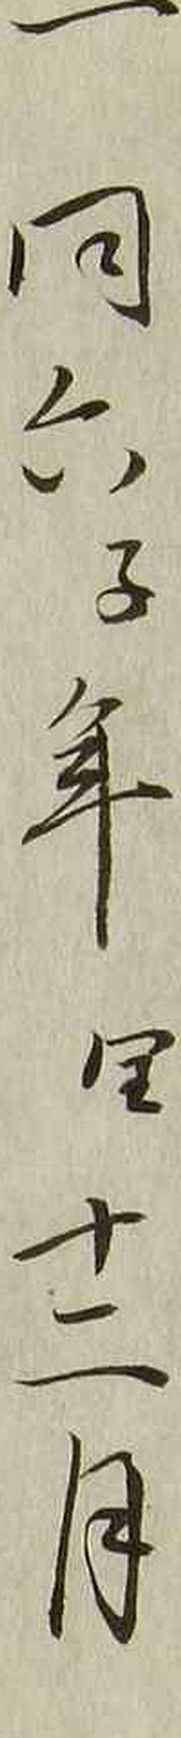一同六子年閏十二月
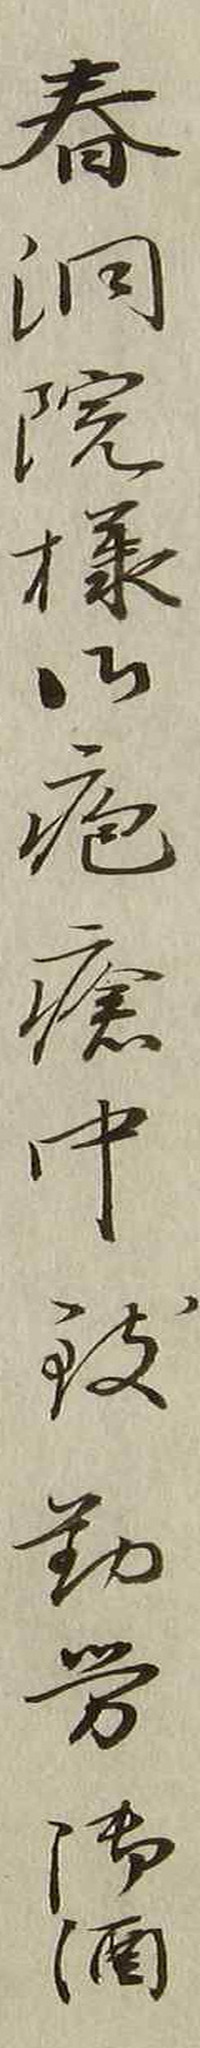春洞院様御疱瘡中勤労致し御酒
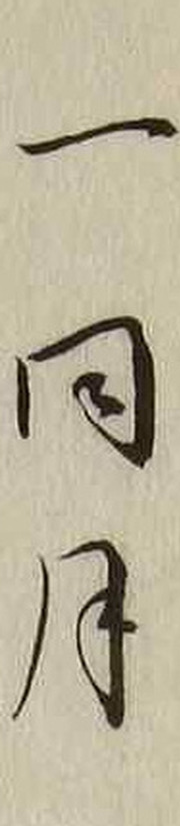一同月
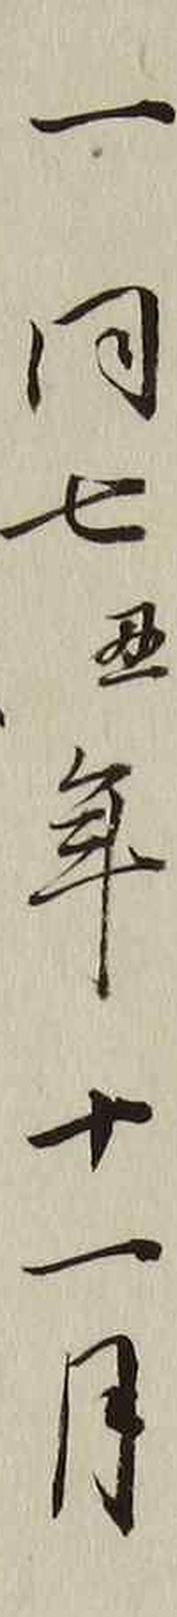一同七丑年十一月
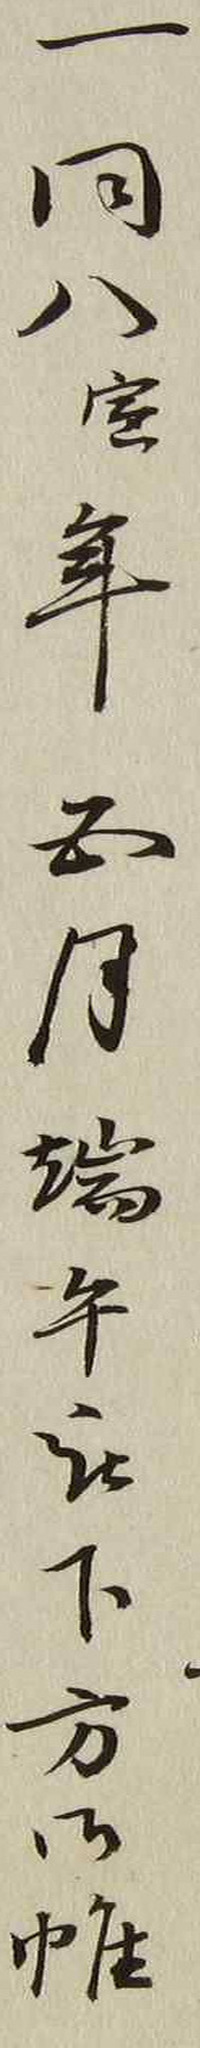一同八寅年五月端午下され方御帷
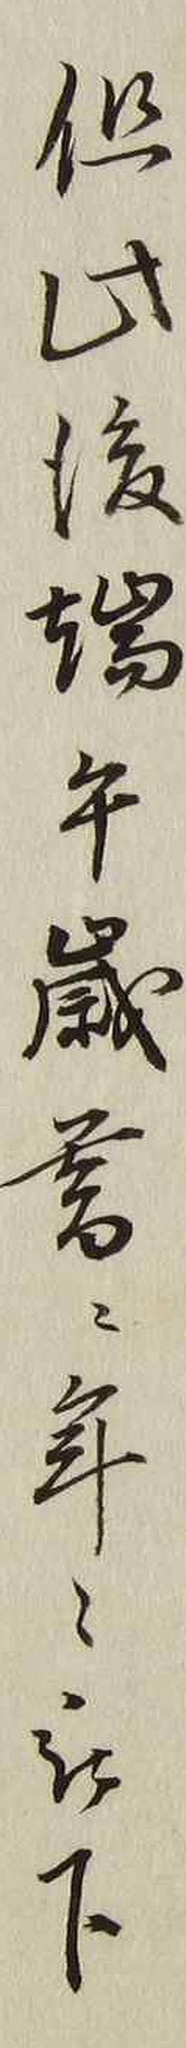但し此後端午歳暮ニ年々下し
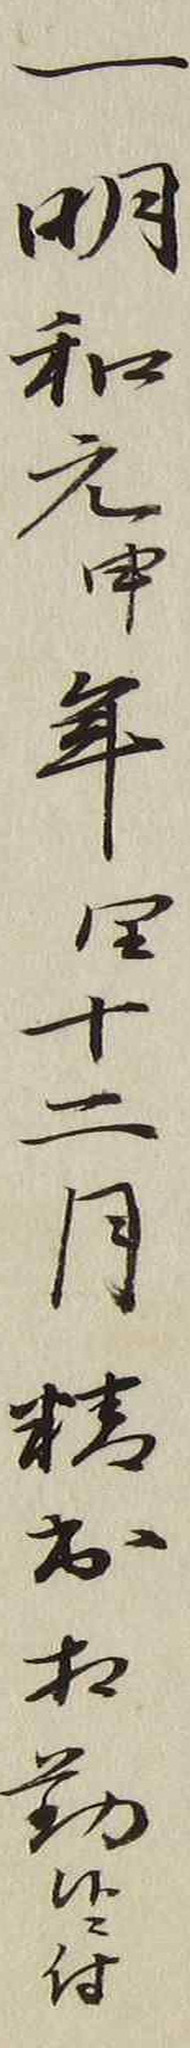一明和元申年閏十二月精出相勤め候ニ付き
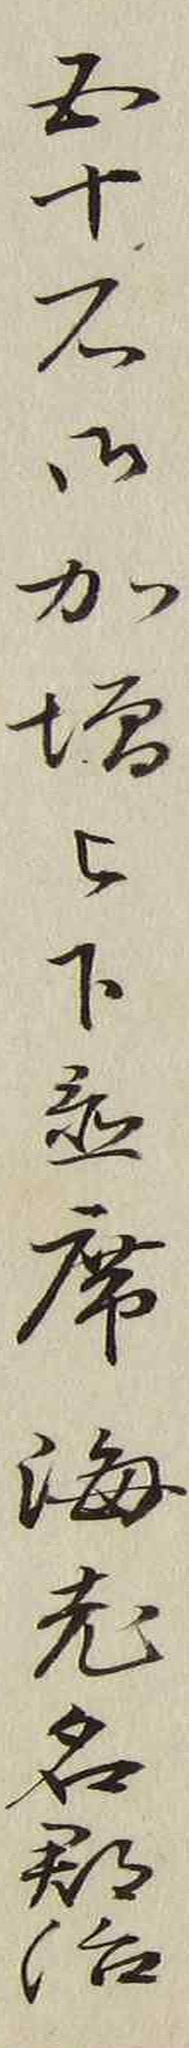五十石御加増下し置かれ席海老名郡治

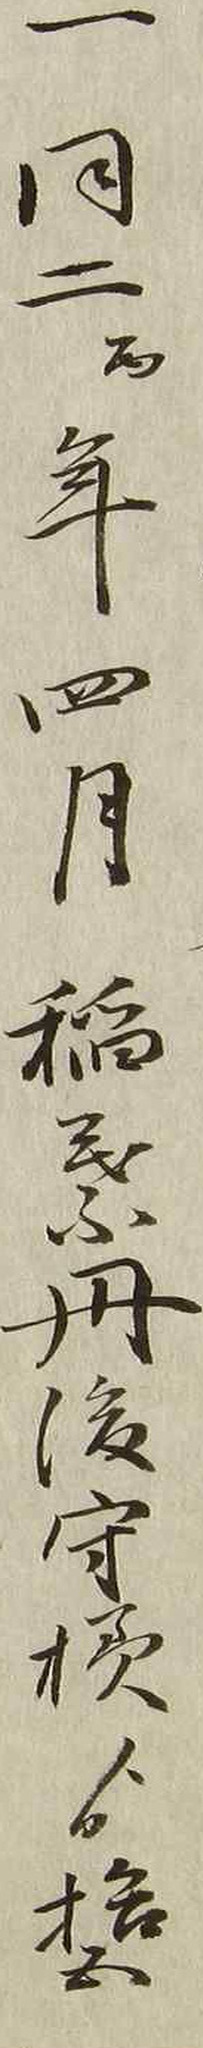一同二酉年四月稲葉丹後守様より拾五
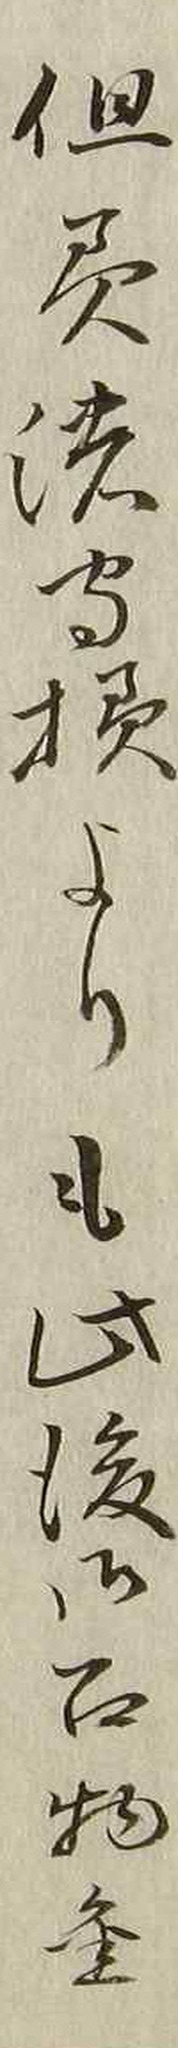但し美濃守様よりも此後御召し物金
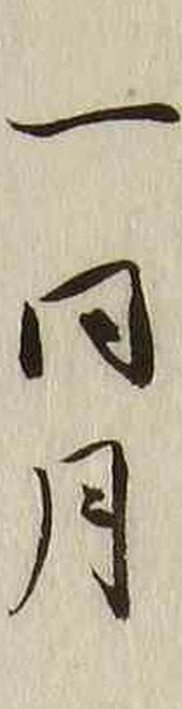一同月
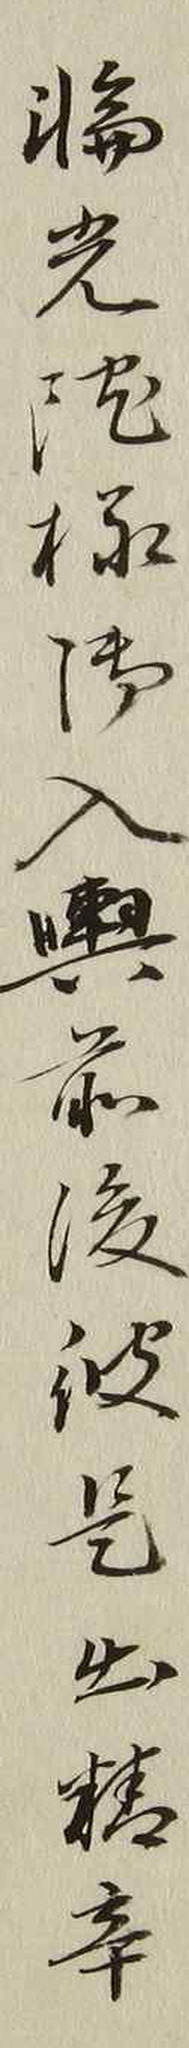輪光院様御入輿前後彼是出精辛
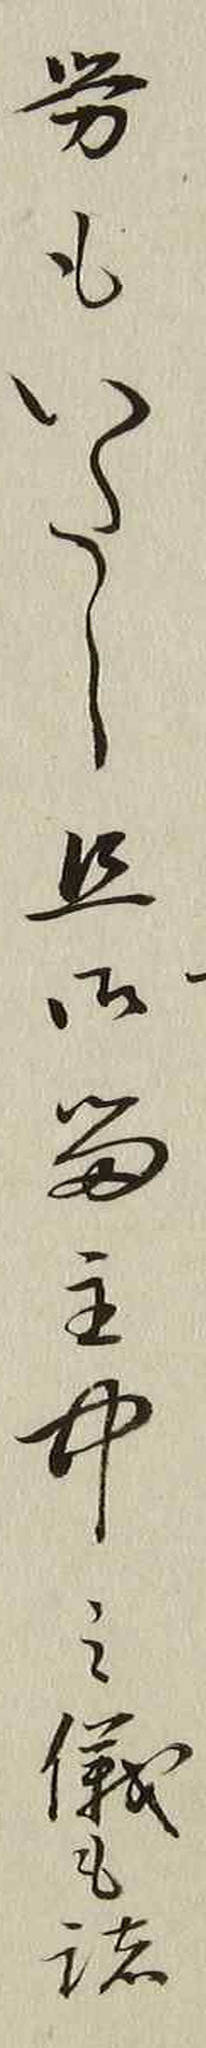労もいたし且つ御留守中之儀も諸
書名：諸士系譜　巻之19　い之部19
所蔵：会津若松市立会津図書館
